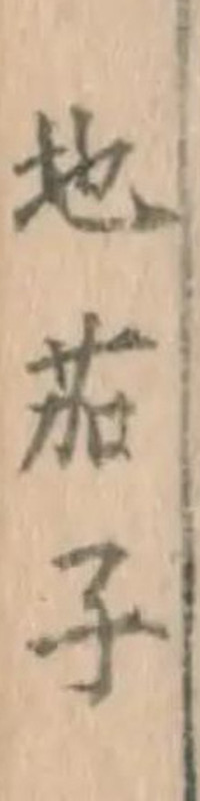地茄子

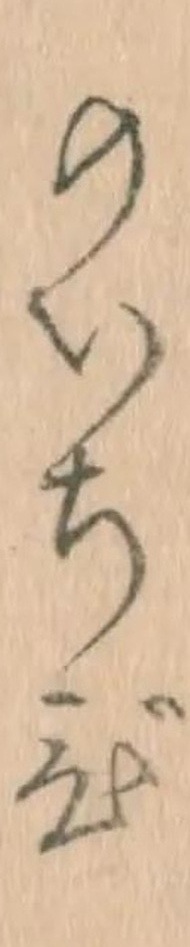のいちび
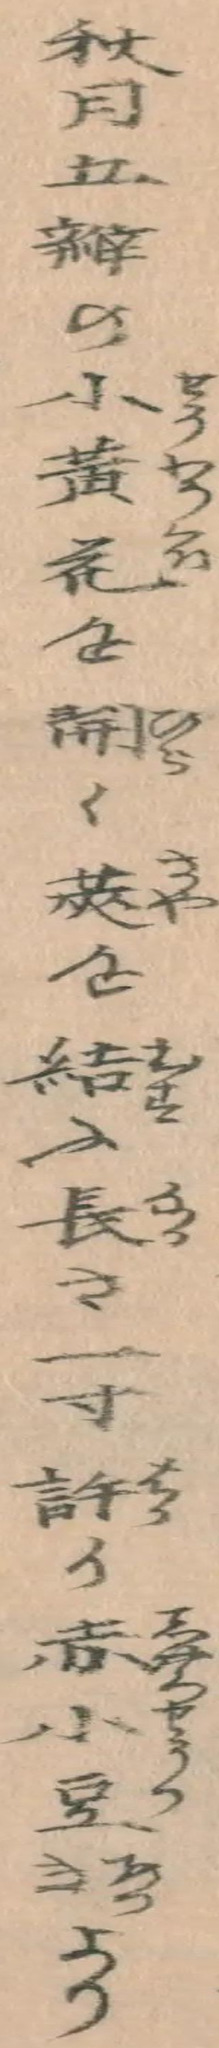秋月五弁の小黄花を開く莢を結ふ長さ一寸許り赤小豆あつきより
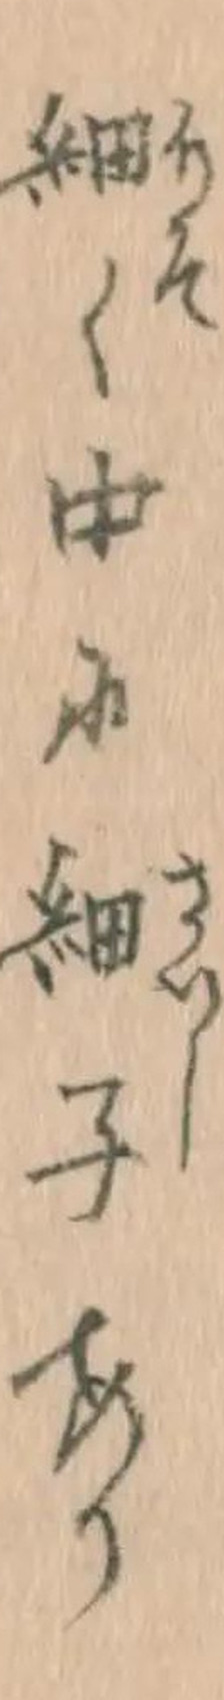細く中に細子あり

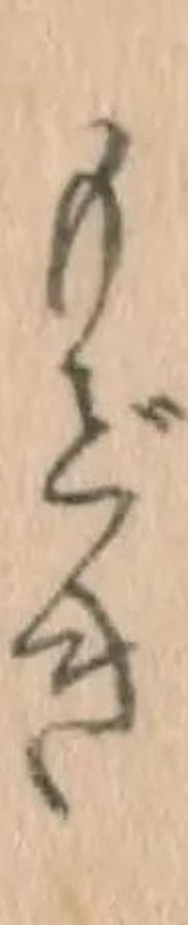もどき
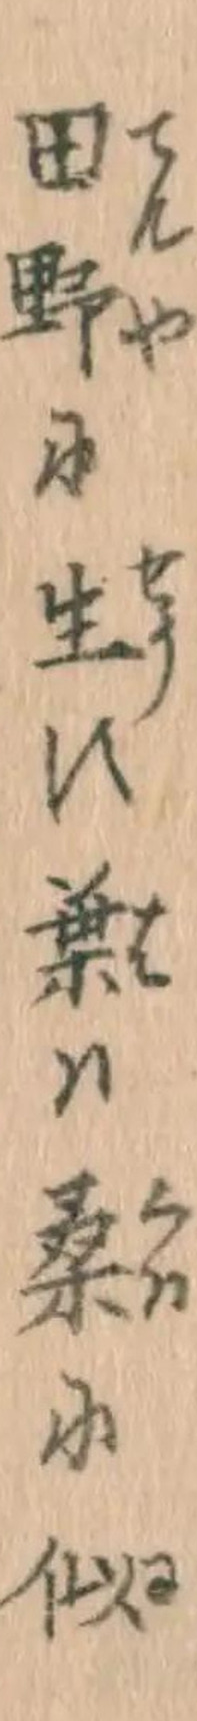田野に生す葉は桑に似
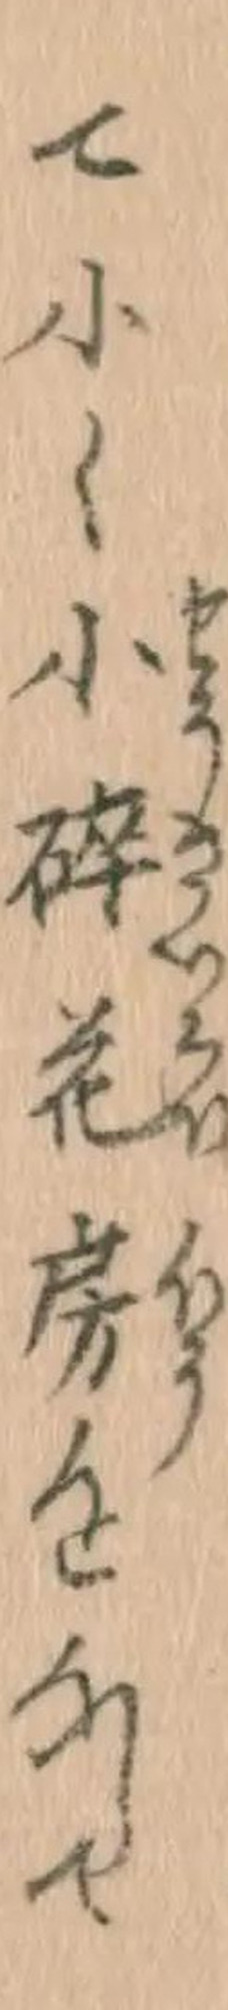て小く小砕花房をなして
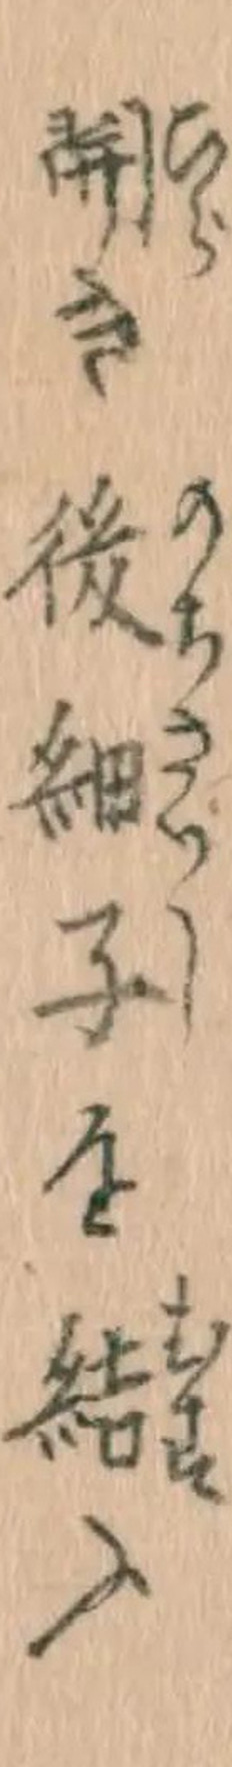開き後細子を結ふ
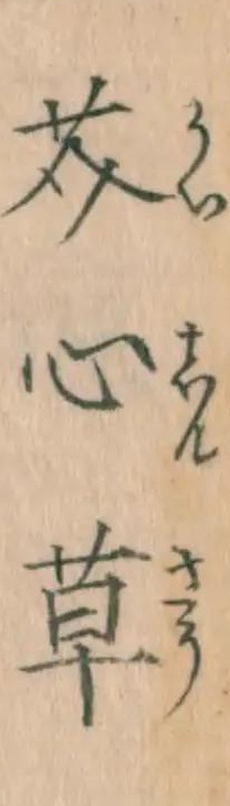芥心草
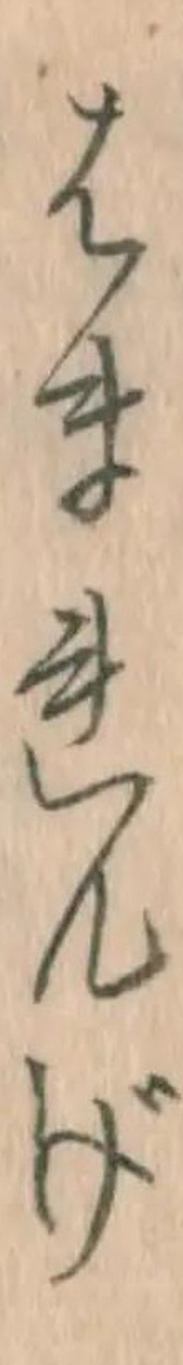はまれんげ
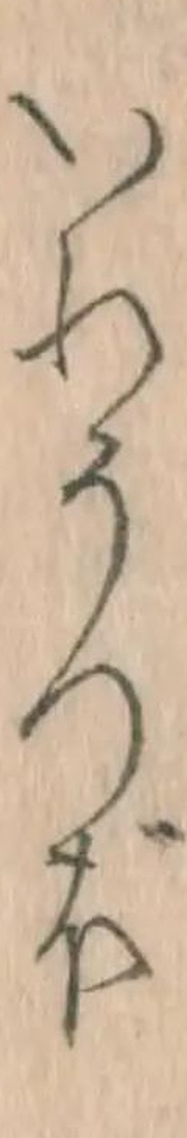いわうつぼ
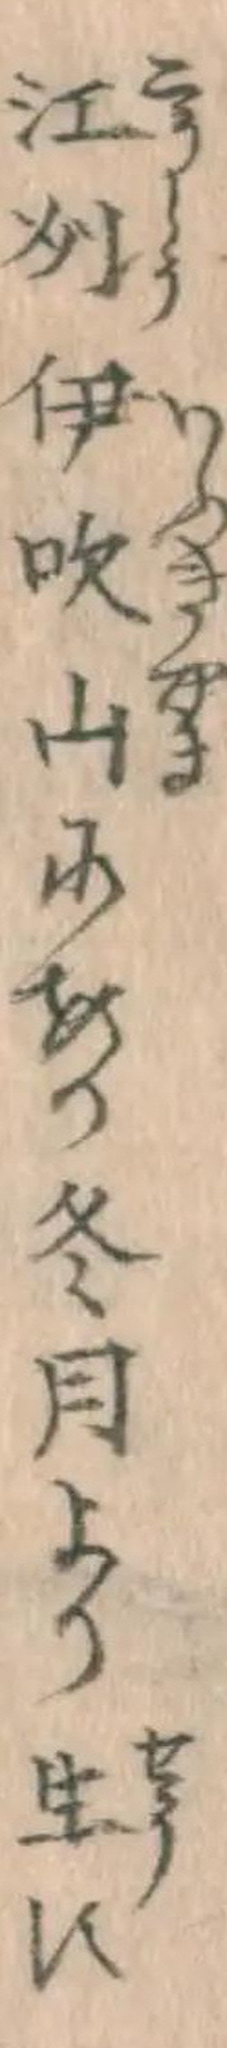江州伊吹山にあり冬月より生す
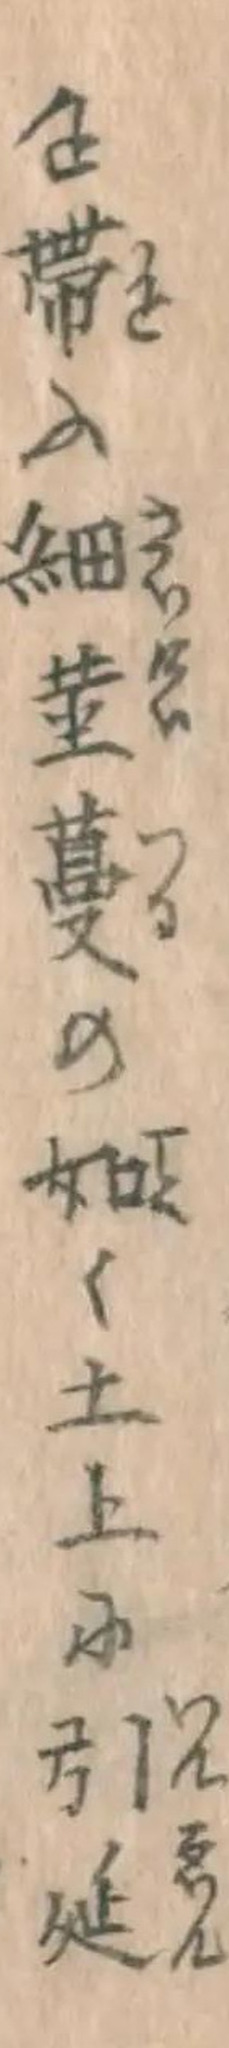を帯ふ細茎蔓の如く土上に引延
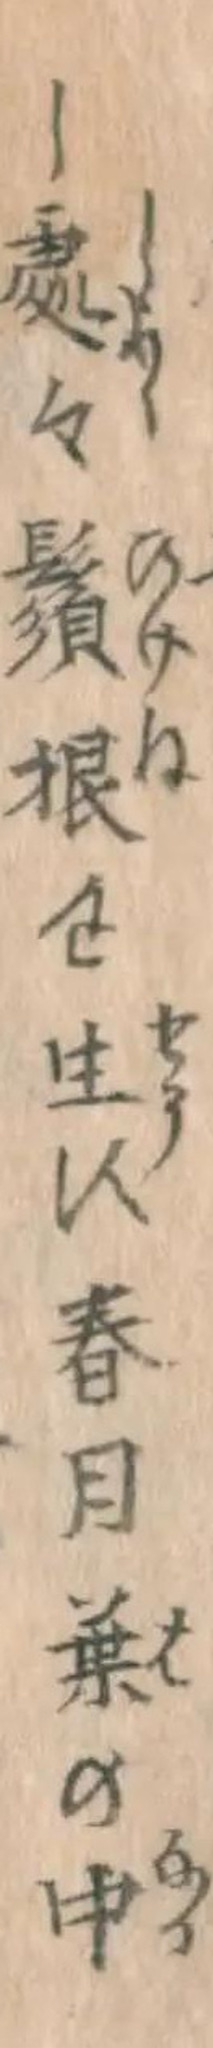し処々鬚根を生す春月葉の中
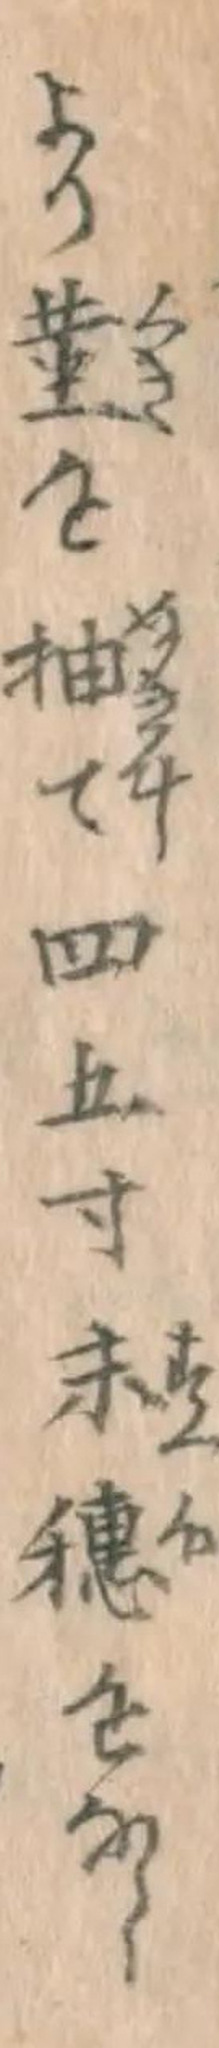より茎を抽て四五寸末穂をなし
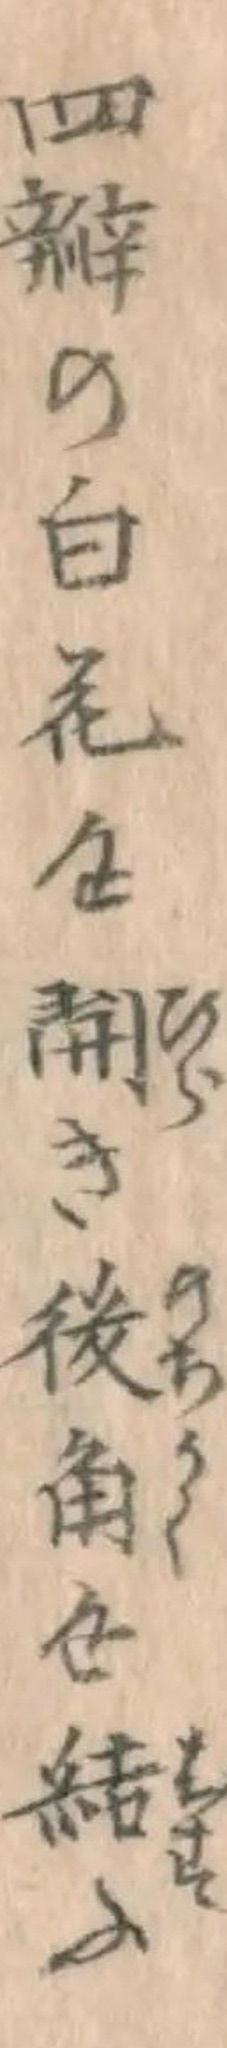四弁の白花を開き後角を結ふ
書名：本草図譜. 巻37-39
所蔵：国立国会図書館 National Diet Library, JAPAN
